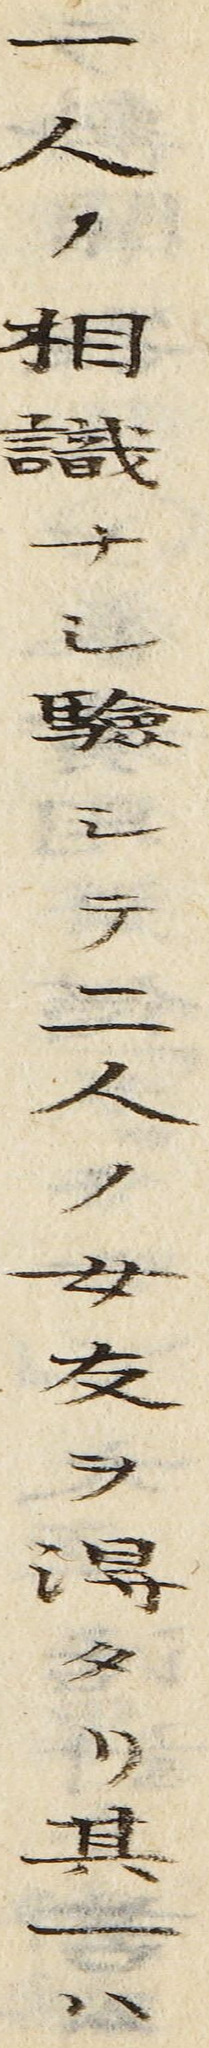一人ノ相識ナシ験シテ二人ノ女友ヲ得タリ其一ハ
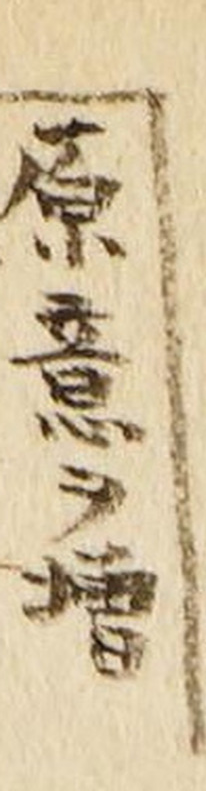原意ヲ増
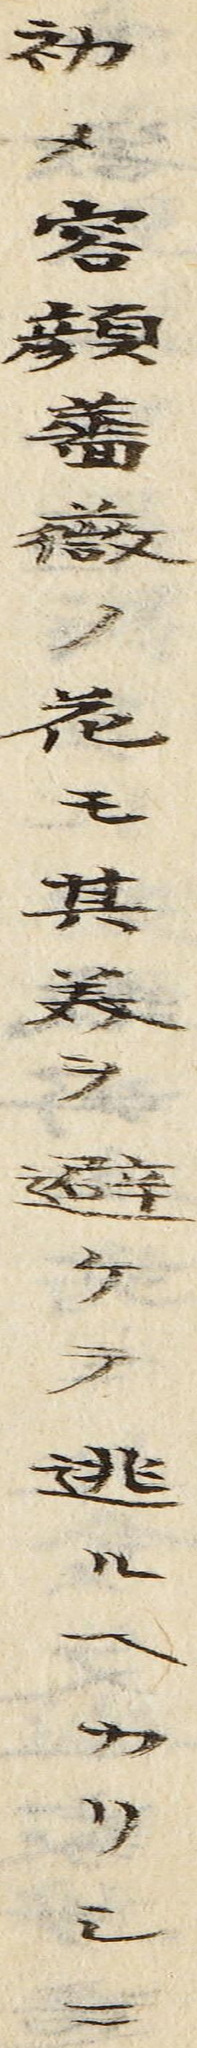初メ容顔薔薇ノ花モ其美ヲ避ケテ逃ルヘカリシニ
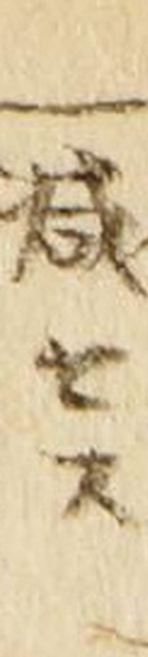減セス
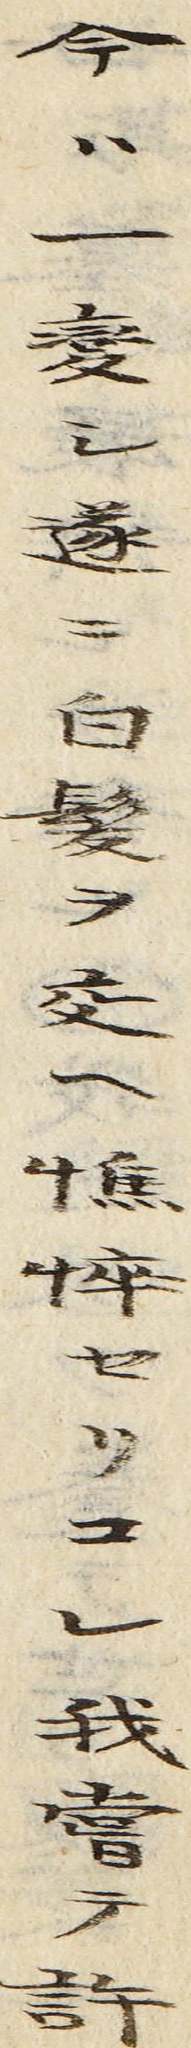今ハ一変シ遂ニ白髪ヲ交ヘ憔悴セリコレ我嘗テ許
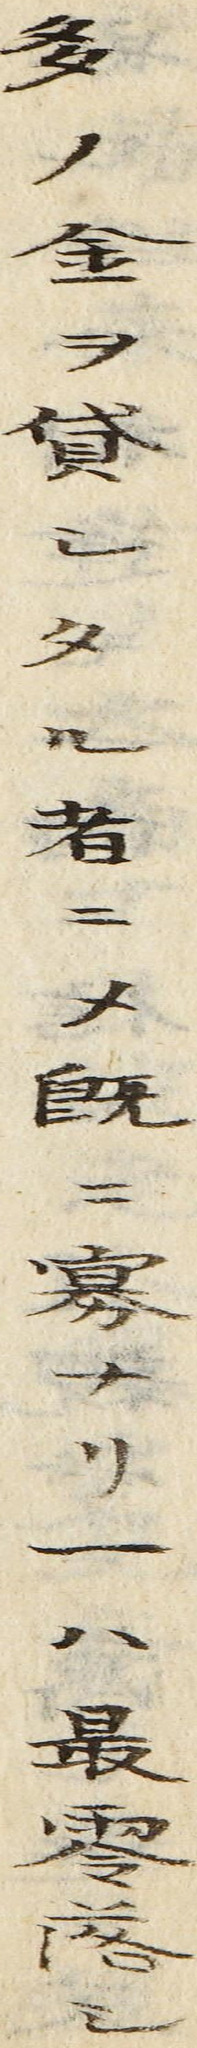多ノ金ヲ貸シタル者ニシテ既ニ寡ナリ一ハ最零落シ
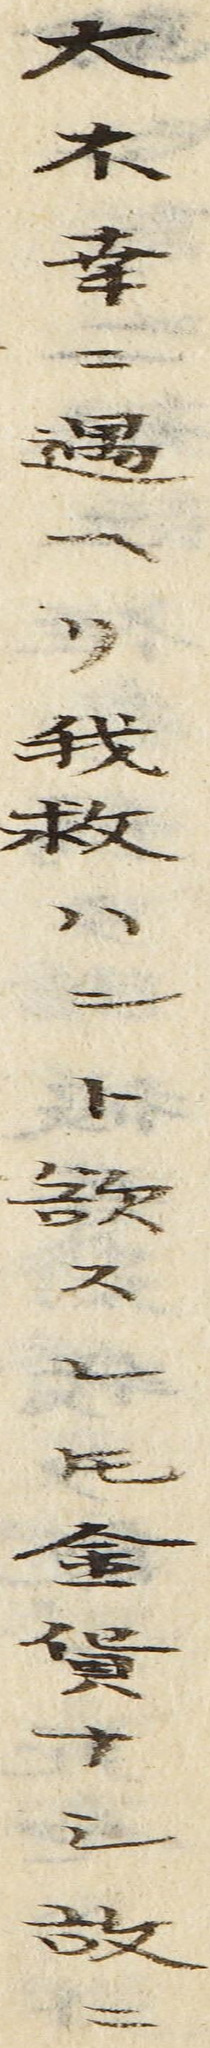大不幸ニ遇ヘリ我救ハント欲スレトモ金貨ナシ故ニ
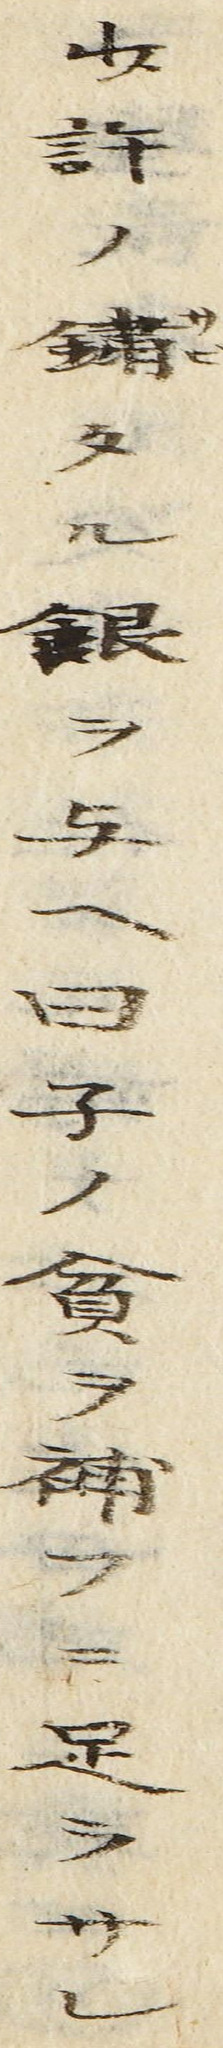少許ノ鏽タル銀ヲ与ヘ曰子ノ貧ヲ補フニ足ラサレ
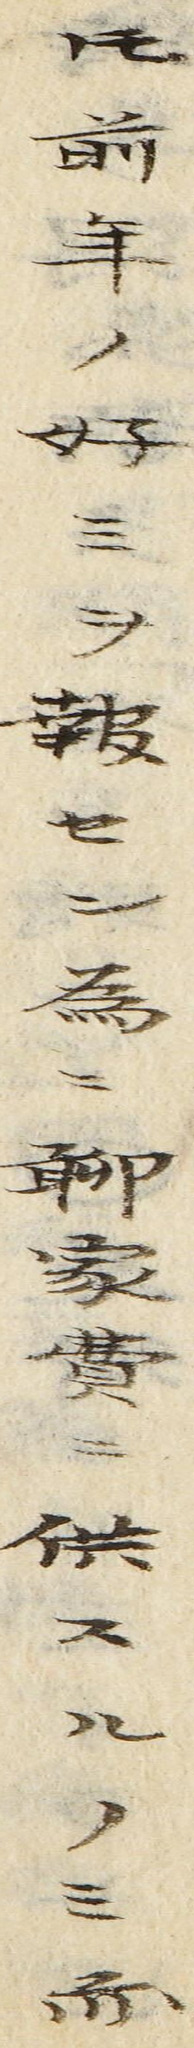トモ前年ノ好ミヲ報セン為ニ聊家費ニ供スルノミ亦

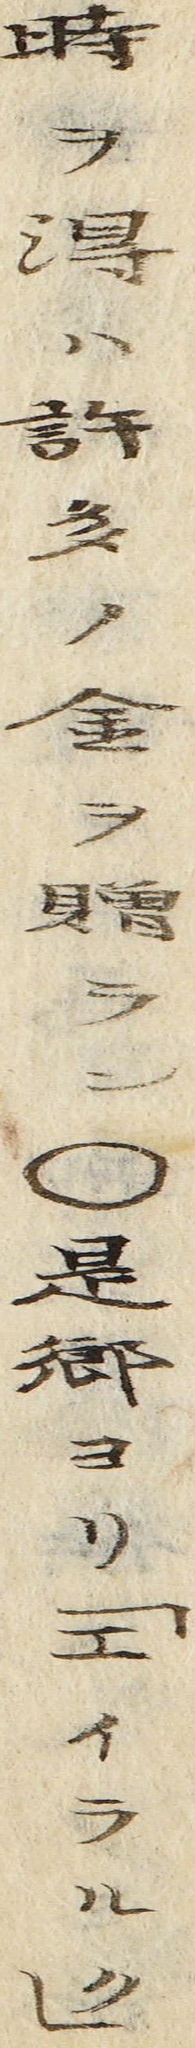時ヲ得ハ許多ノ金ヲ贈ラン◯是郷ヨリ「エイラルク」
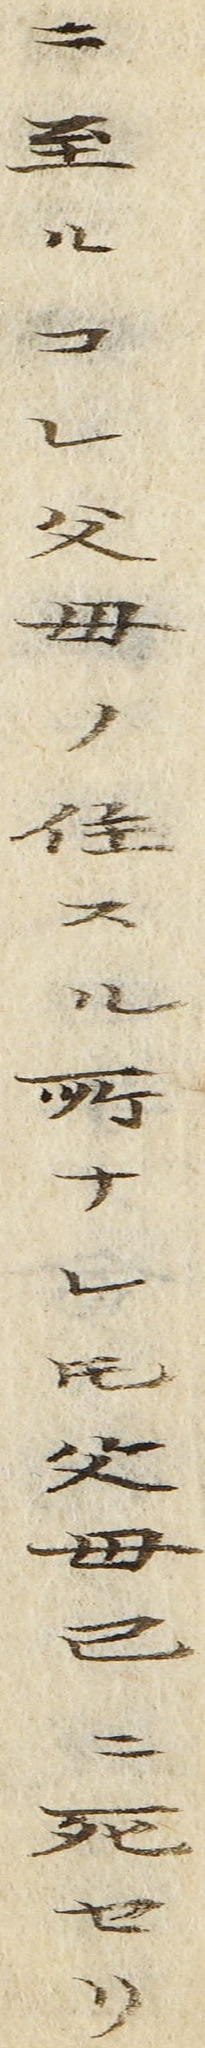ニ至ルコレ父母ノ住スル所ナレトモ父母已ニ死セリ
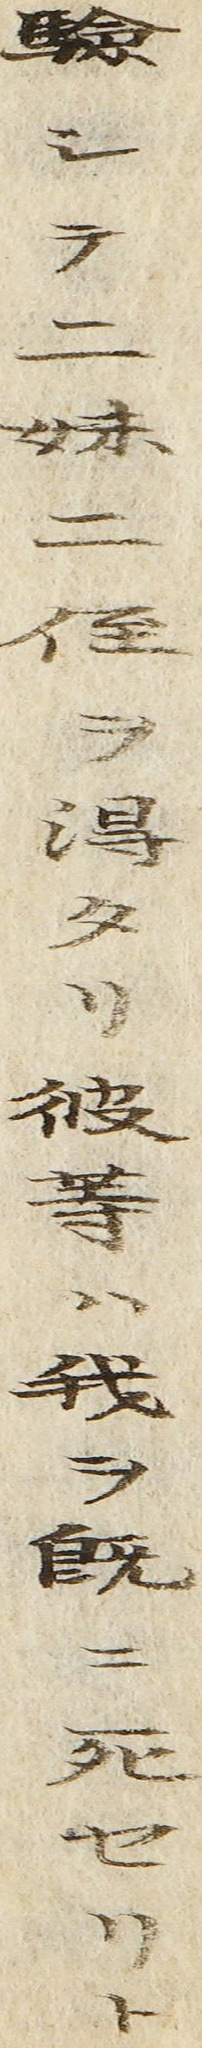験シテ二妹二侄ヲ得タリ彼等ハ我ヲ既ニ死セリト
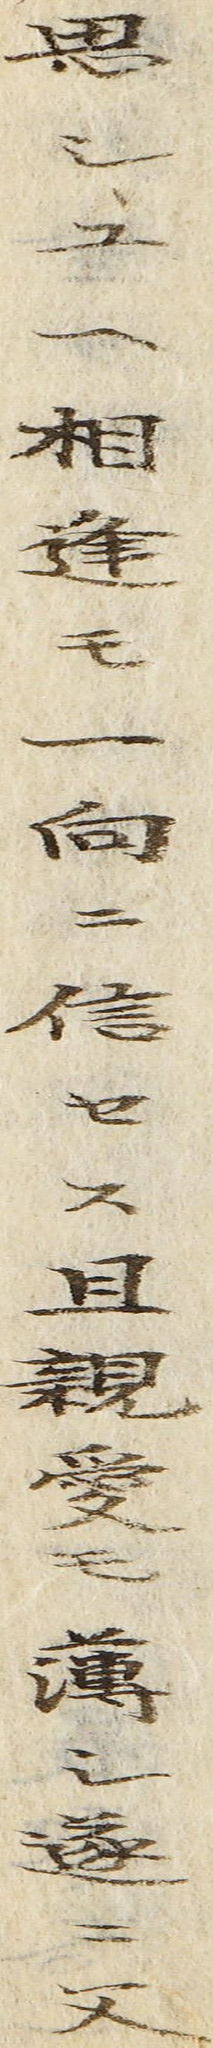思シユヘ相逢モ一向ニ信セス且親愛モ薄シ遂ニ父
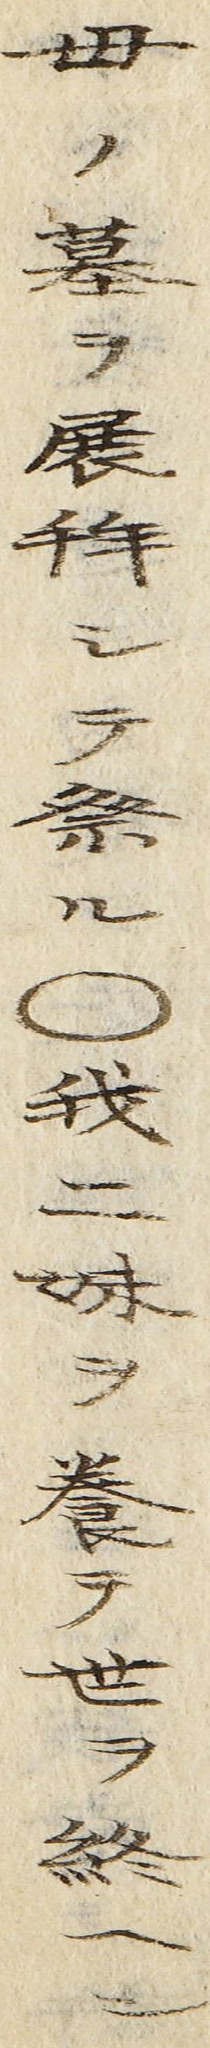母ノ墓ヲ展拝シテ祭ル◯我二妹ヲ養テ世ヲ終ヘン
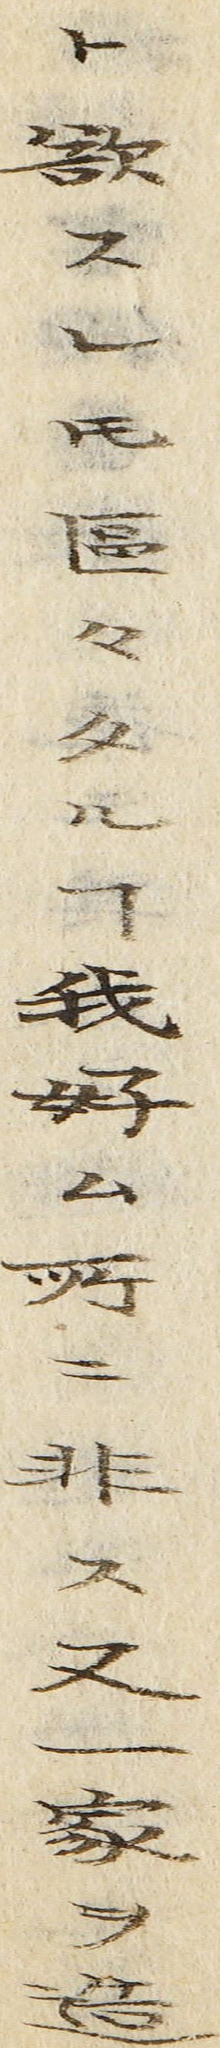ト欲スレトモ区々タルコト我好ム所ニ非ス又一家ヲ造
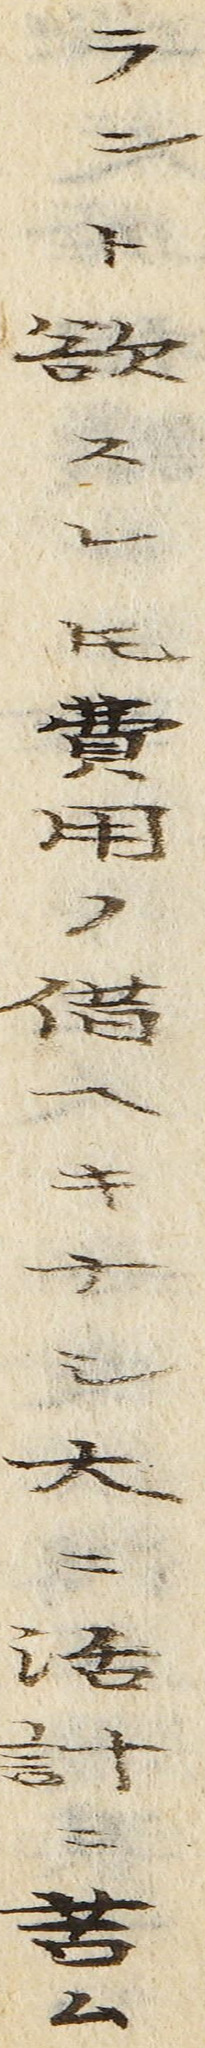ラント欲スレトモ費用ノ借ヘキナシ大ニ活計ニ苦ム
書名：漂流紀事
